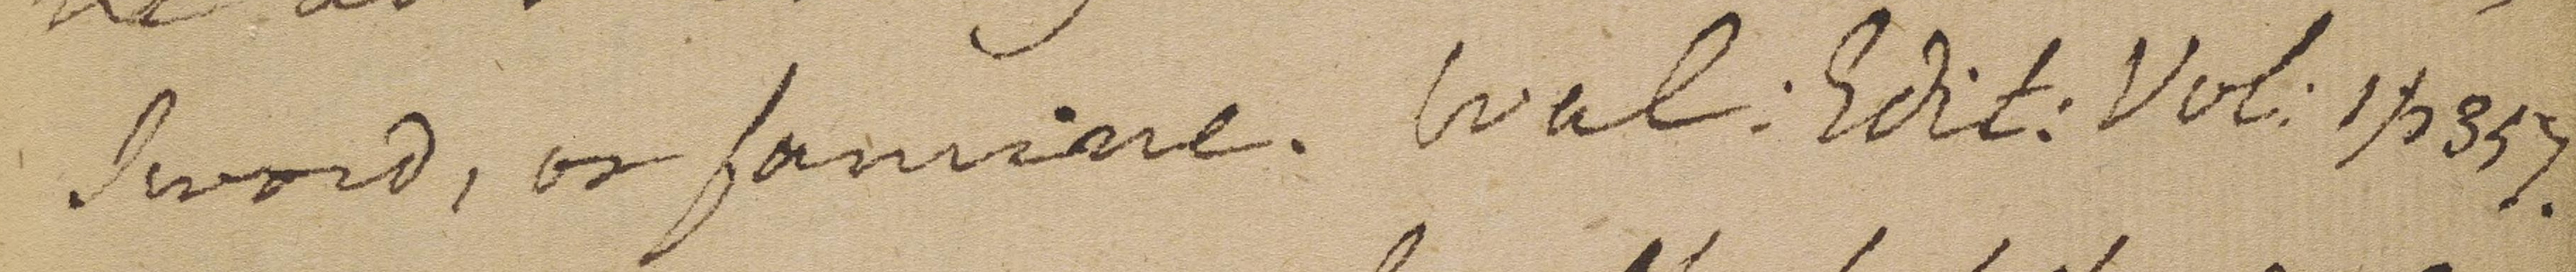sword, or famine. Wal: Edit: Vol. 1 p. 397
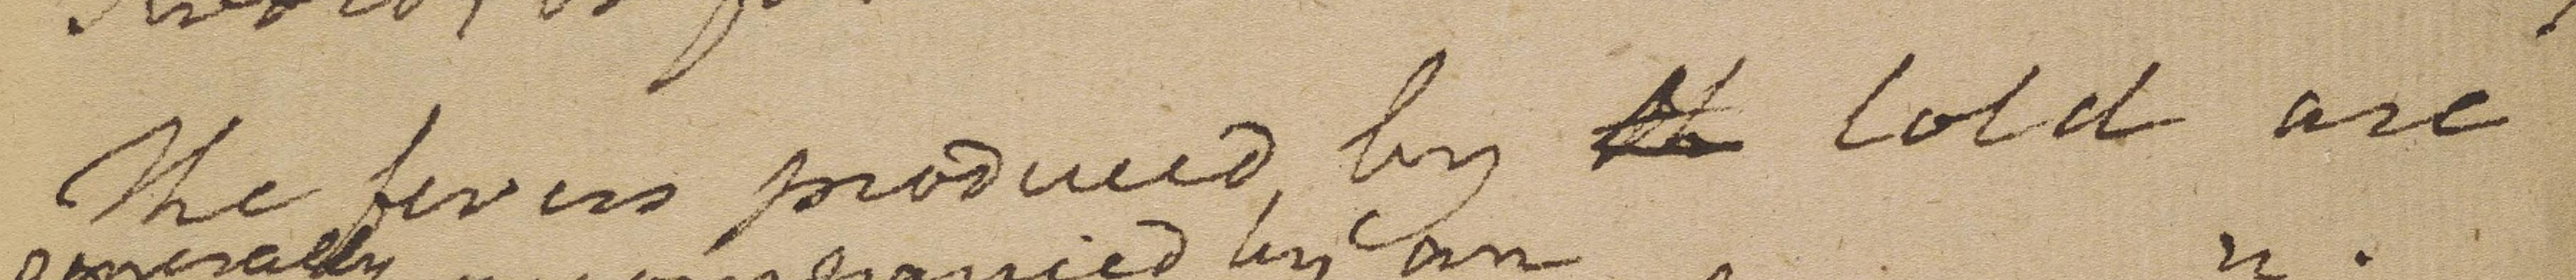The fevers produced by [th-] cold are
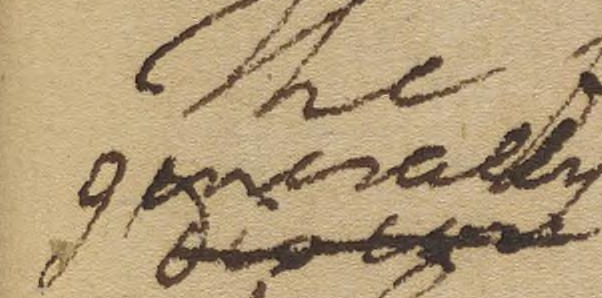generally
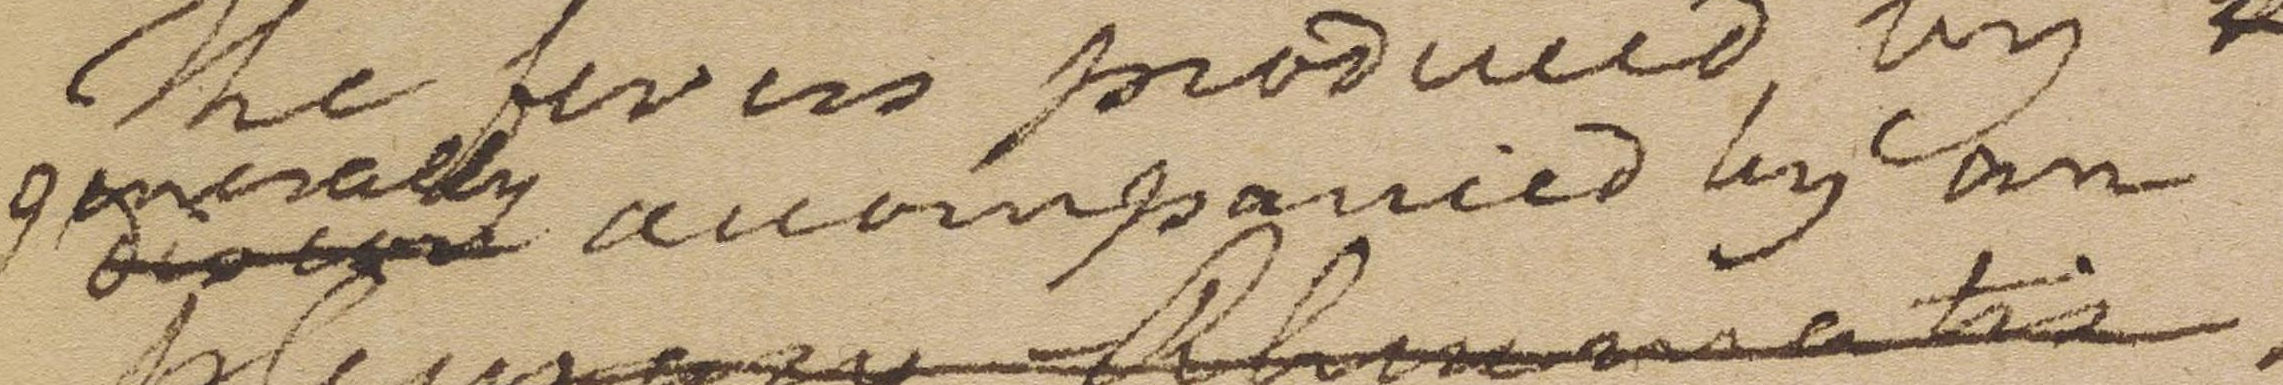[diseases] accompanied by an
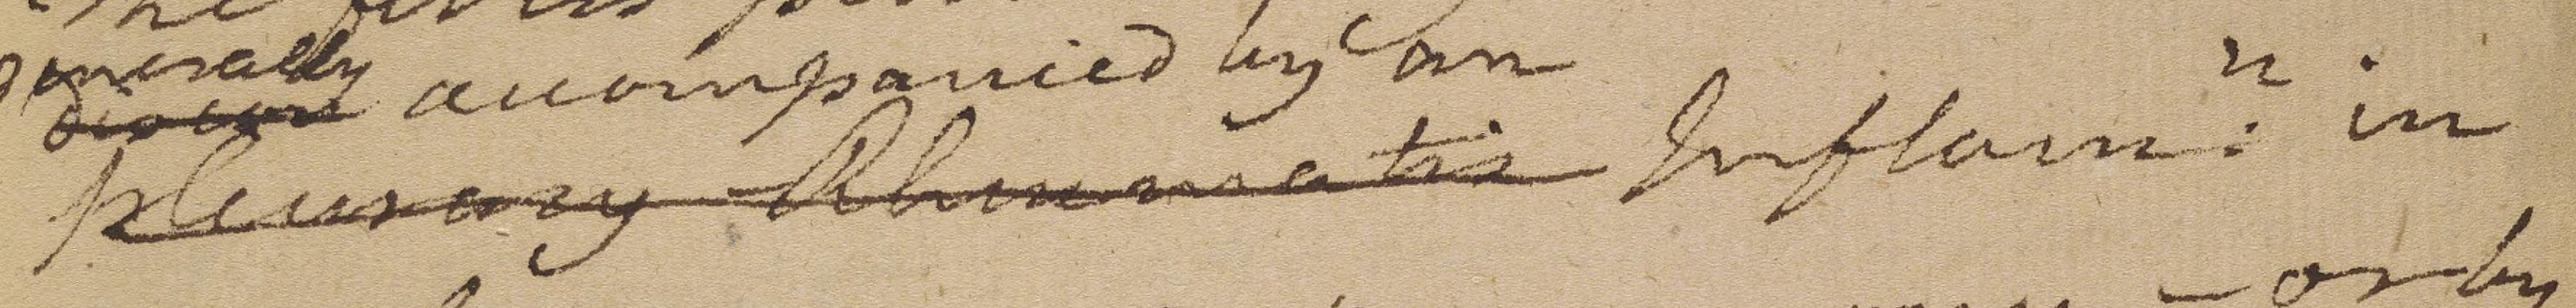[pleusary Rheumatis] Inflam^n: in
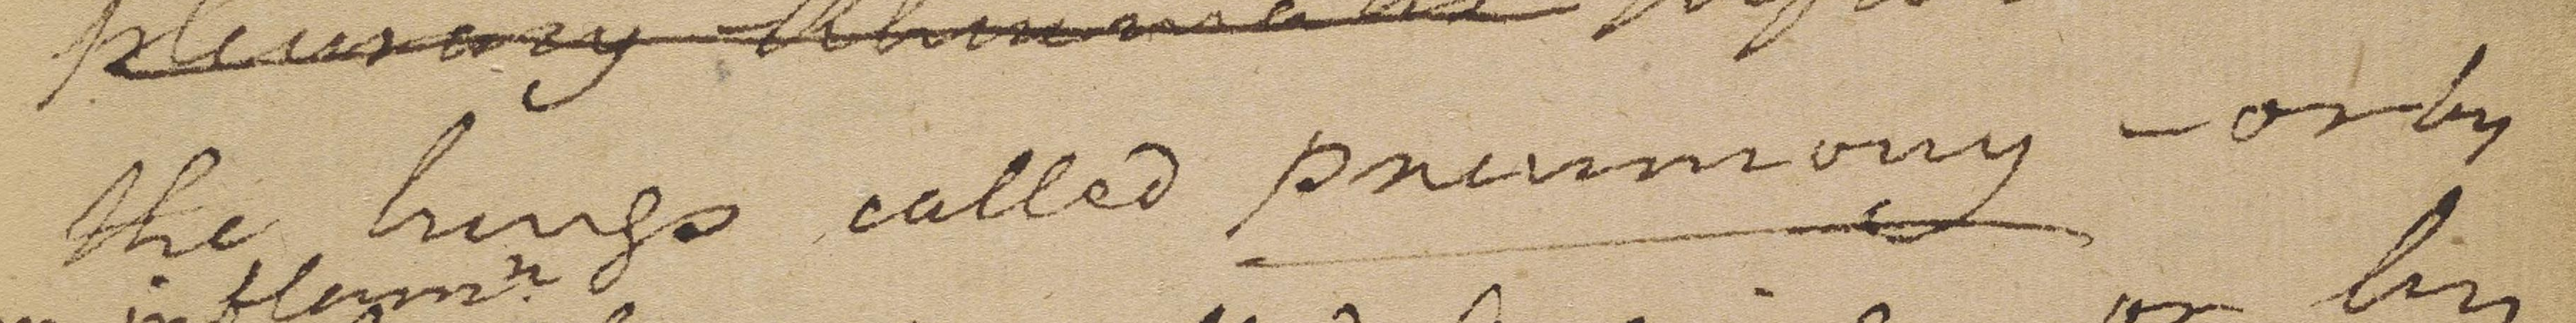the lungs called pneumony- or by
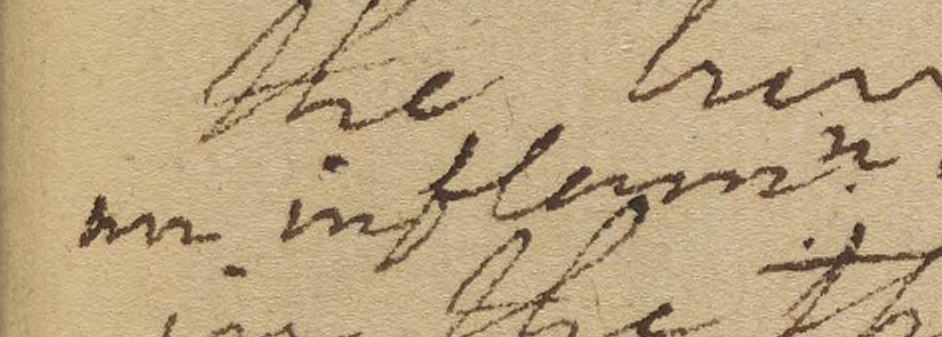an inflam^n
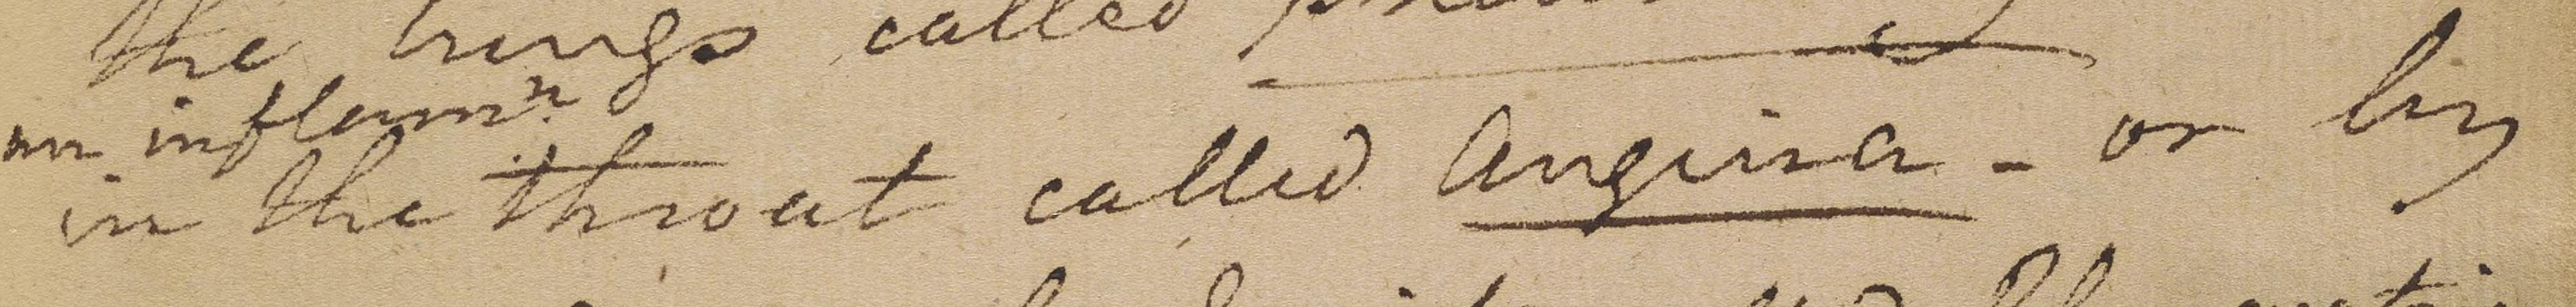in the throat called Angina- or by
